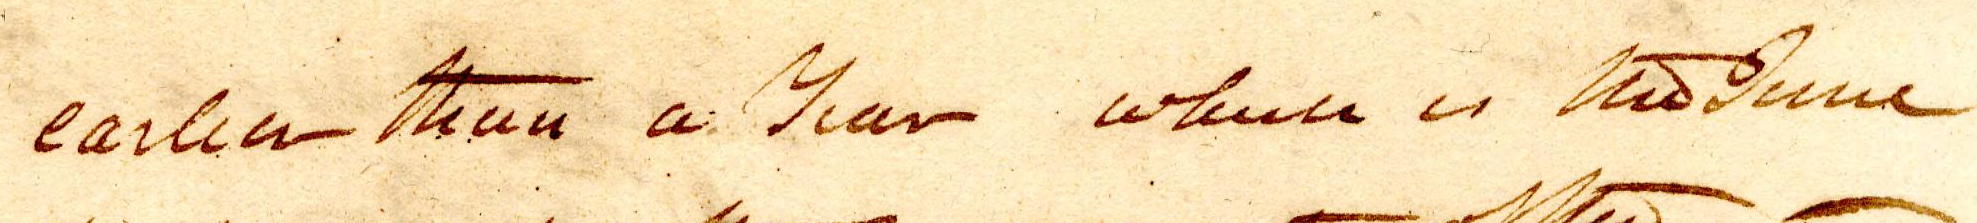earlier than a Year which is the June
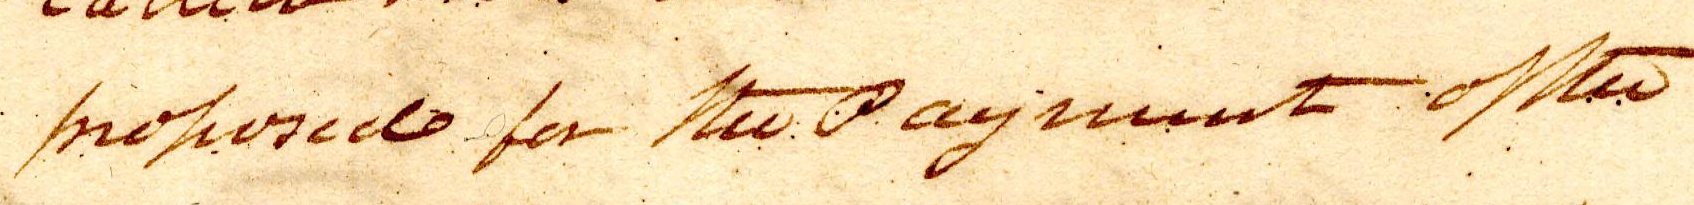proposed for thee Payment of thee
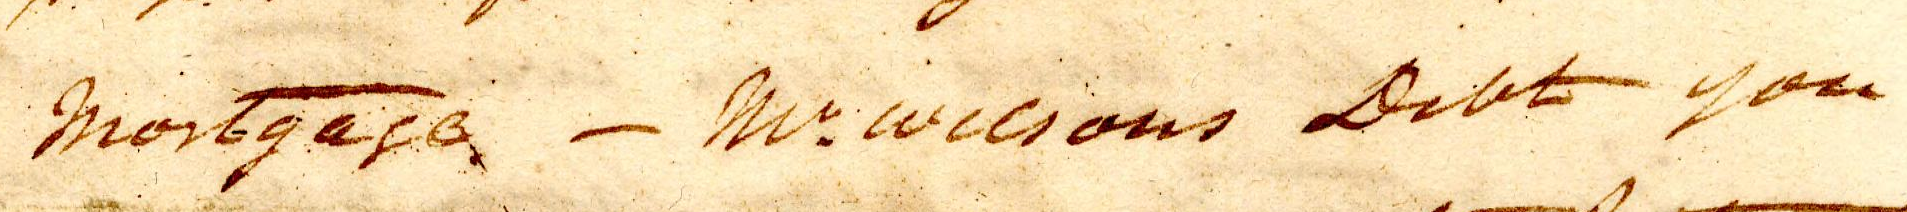Mortgage.- W^m. Wilsons Debt you
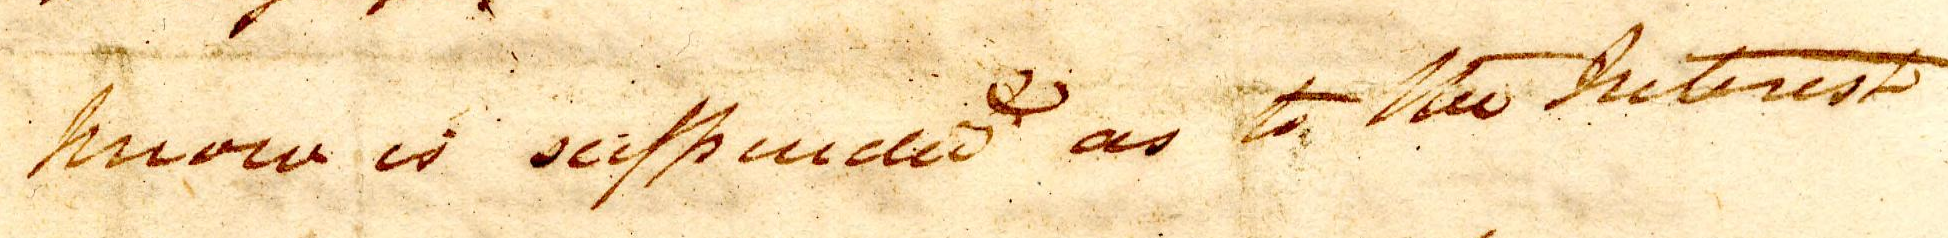know is suspended as to thee Interest
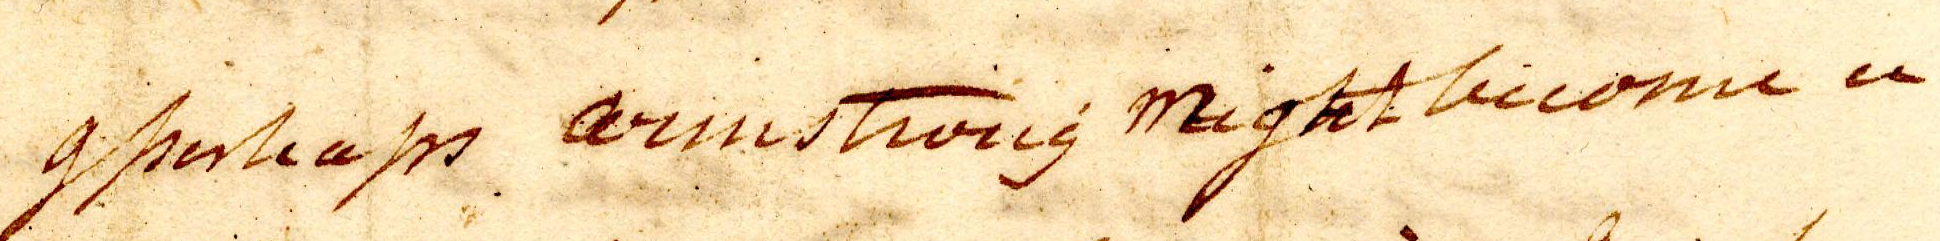& perhaps Armstiong Might become a
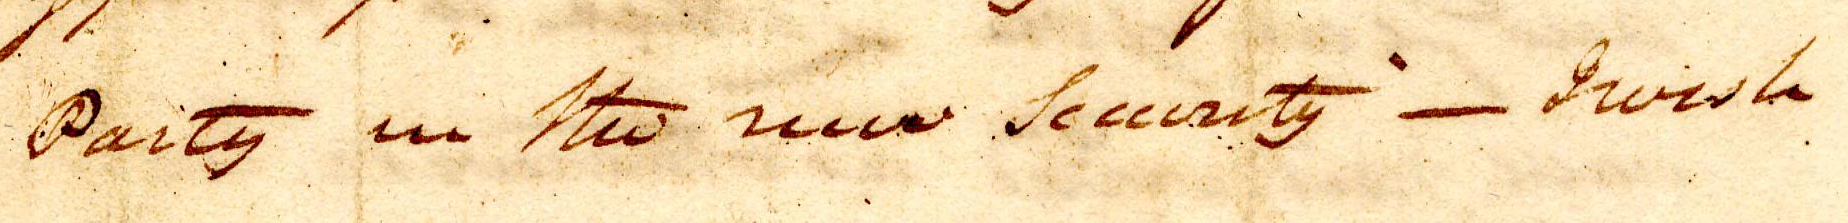Party in thee new Security. I wish
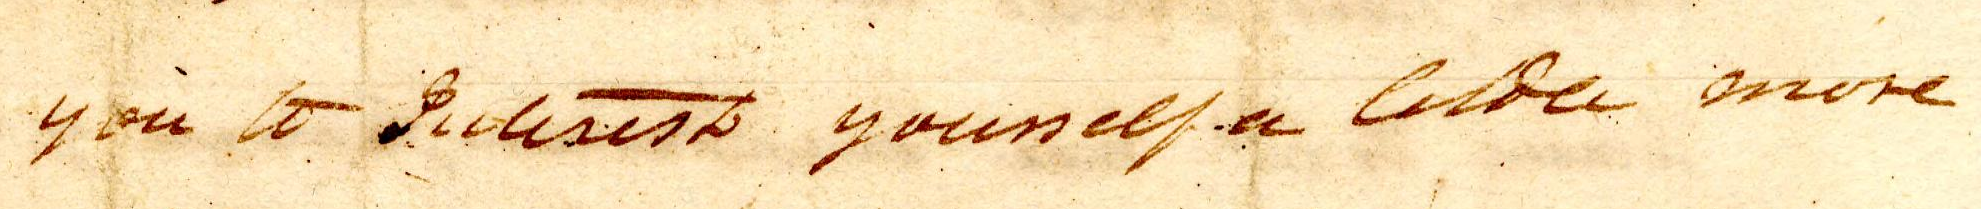you to Interest yourself a little more
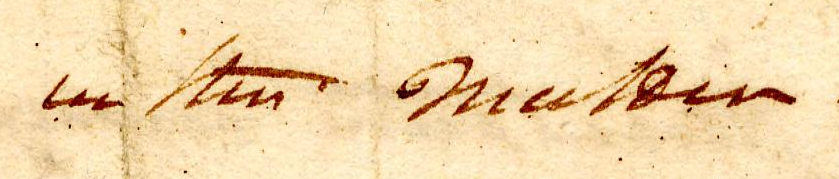in this Matter
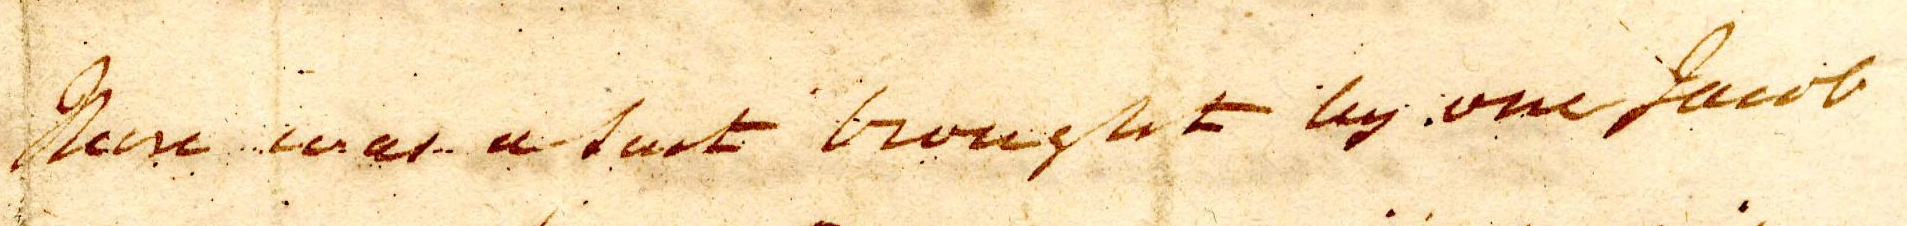There was a suit brought by one Jacob
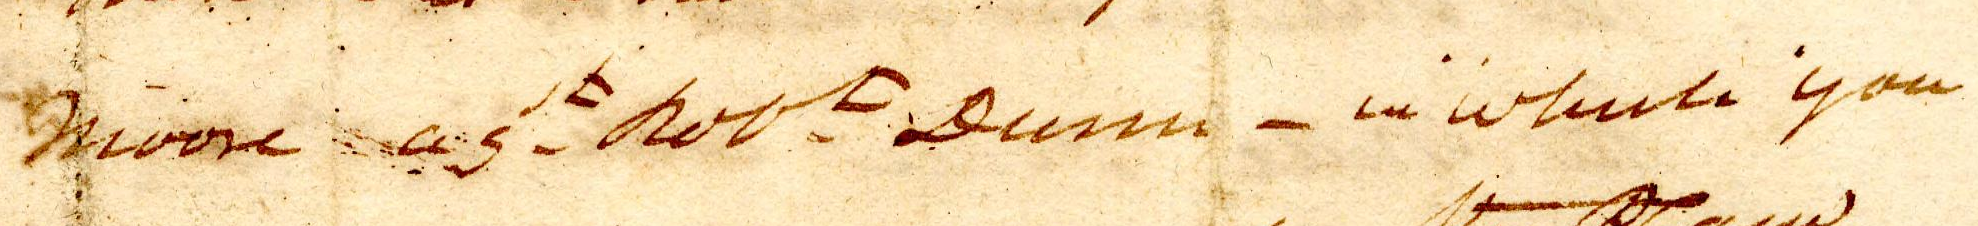Moore- ag^st. Rob^t. Dunn, in which you
